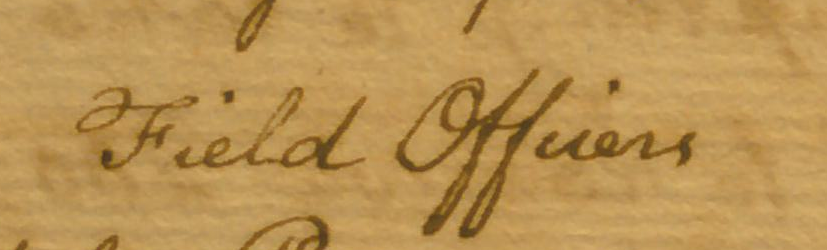Field Officers
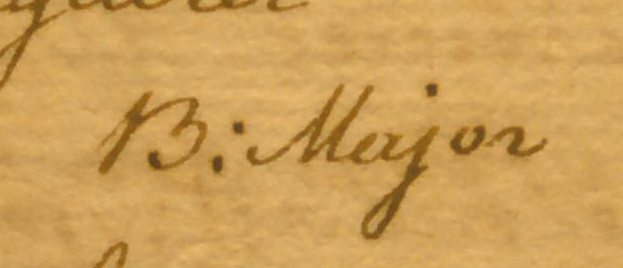B: Major
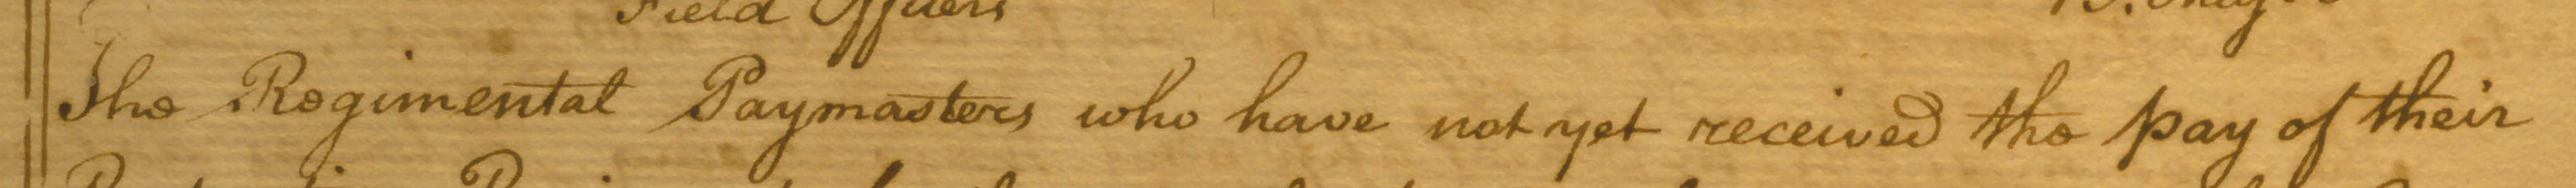The Regimental Paymasters who have not yet received the pay of their
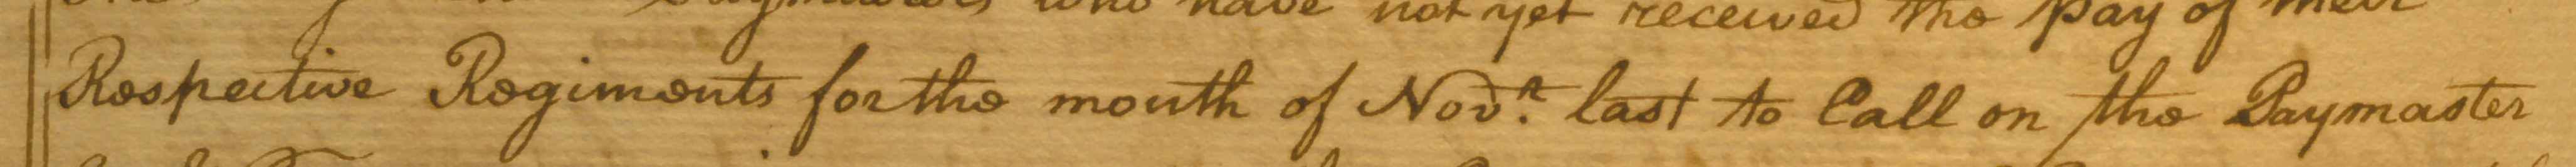Respective Regiments for the month of Nov^r. last to Call on the Paymaster
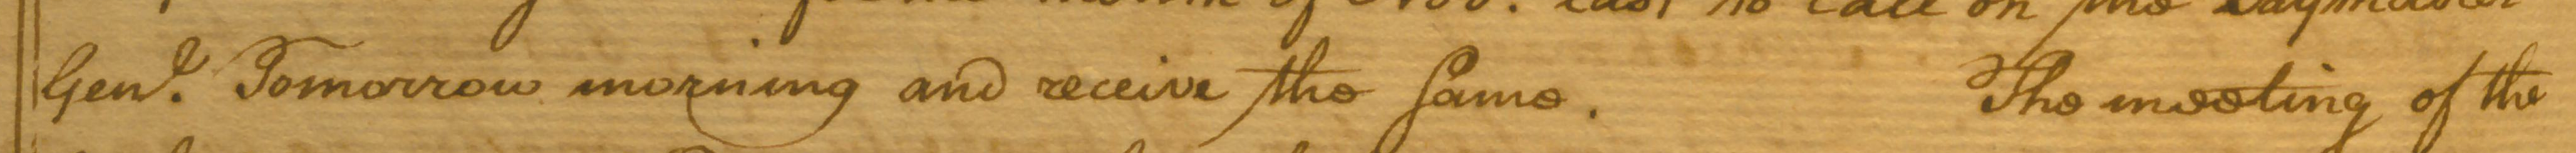Gen^l. Tomorrow morning and receive the same. The meeting of the
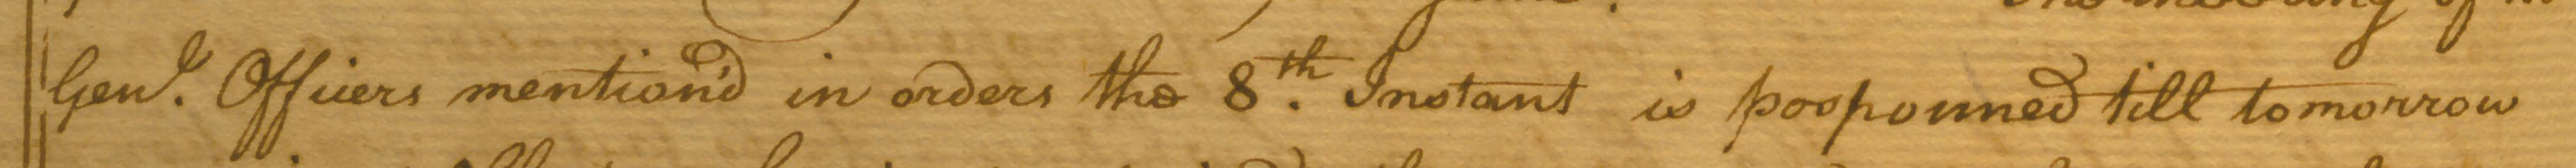Gen^l. Officers mention'd in orders the 8^th. Instant is posponned till tomorrow
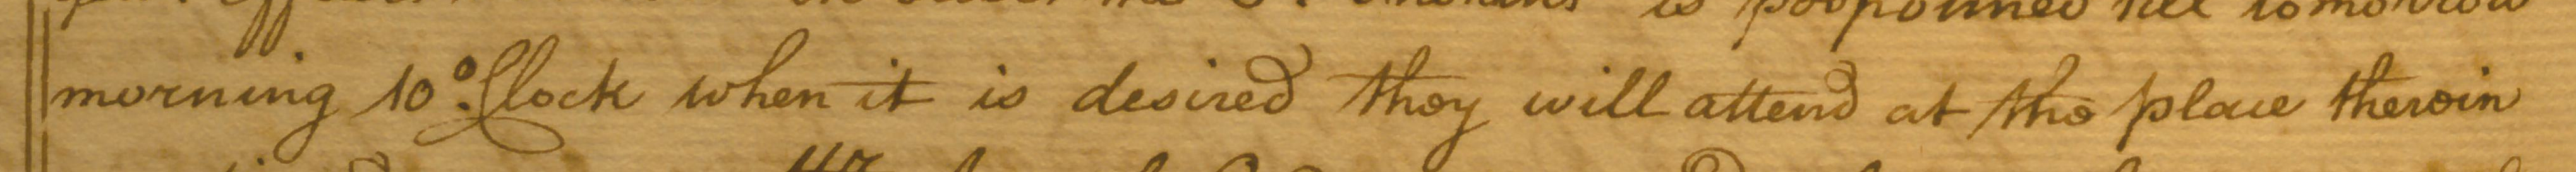morning 10 ^o.Clock when it is desired they will attend at the place therein
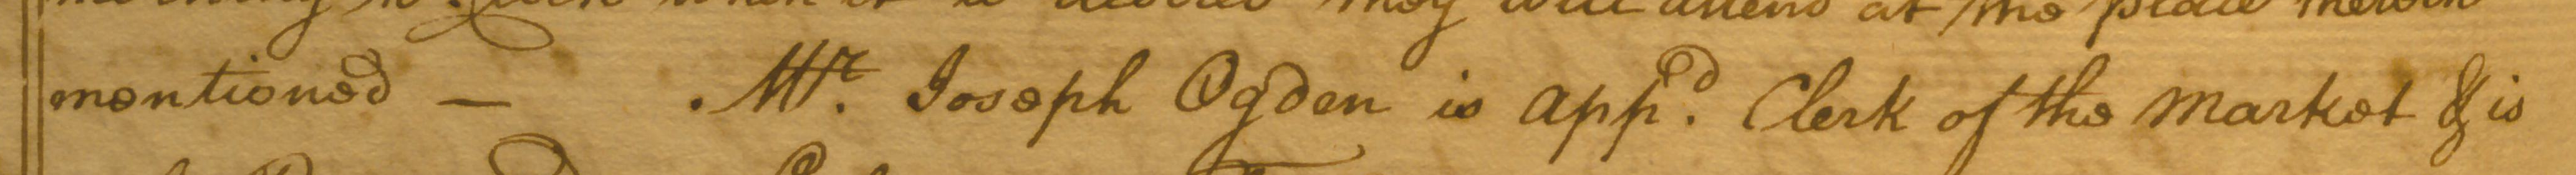mentiond- M^r. Joseph Ogden is app^d. Clerk of the market & is
